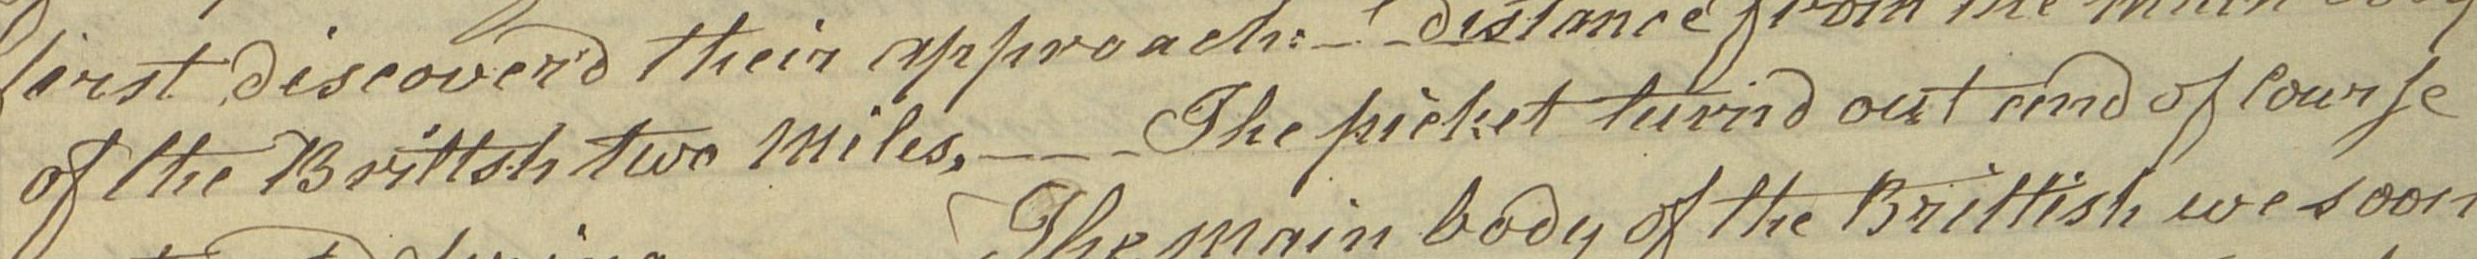of the Brittish two miles, The picket turnd out and of course
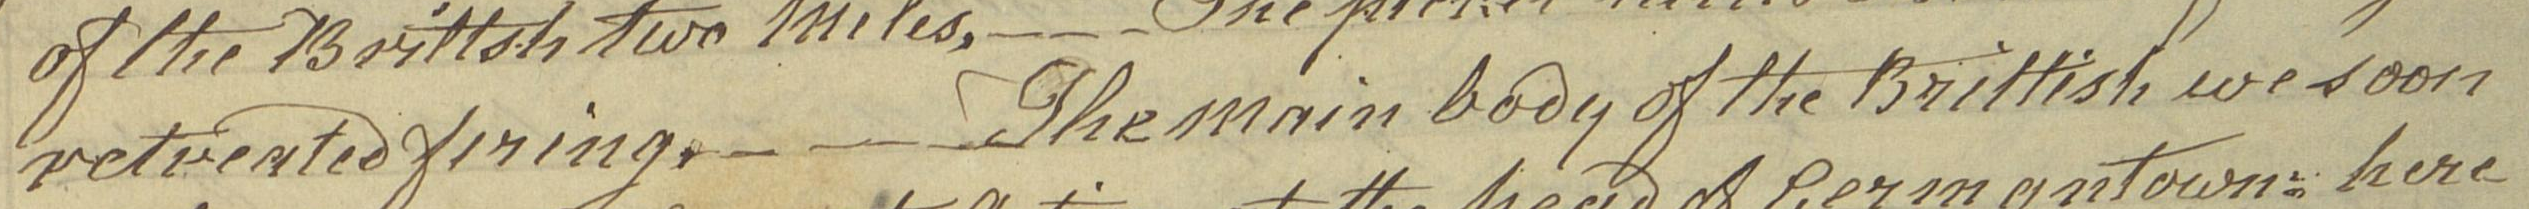retreated firing, The main body of the Brittish we soon
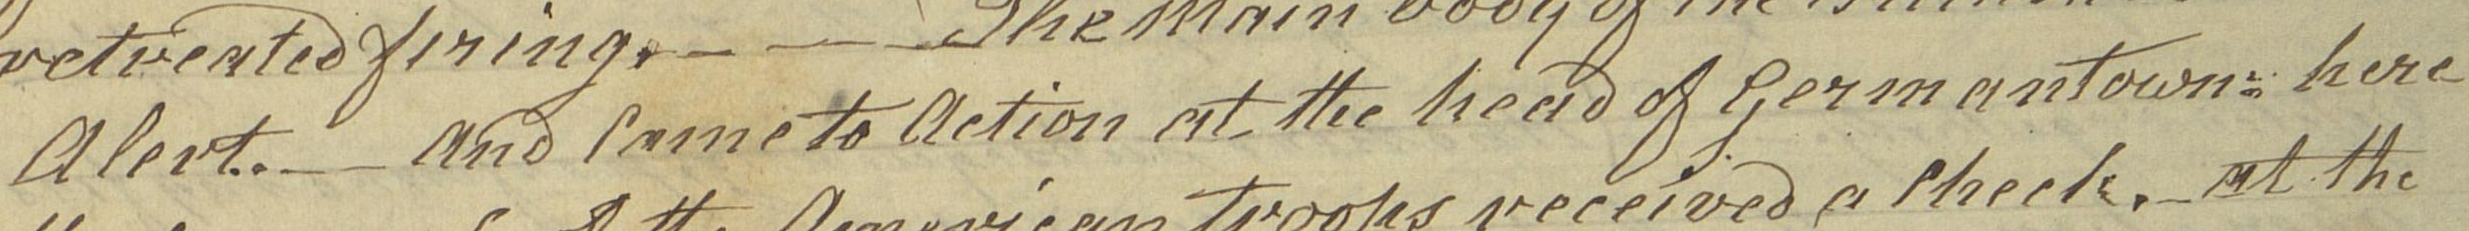Alert. And came to Action at the head of Germantown: here
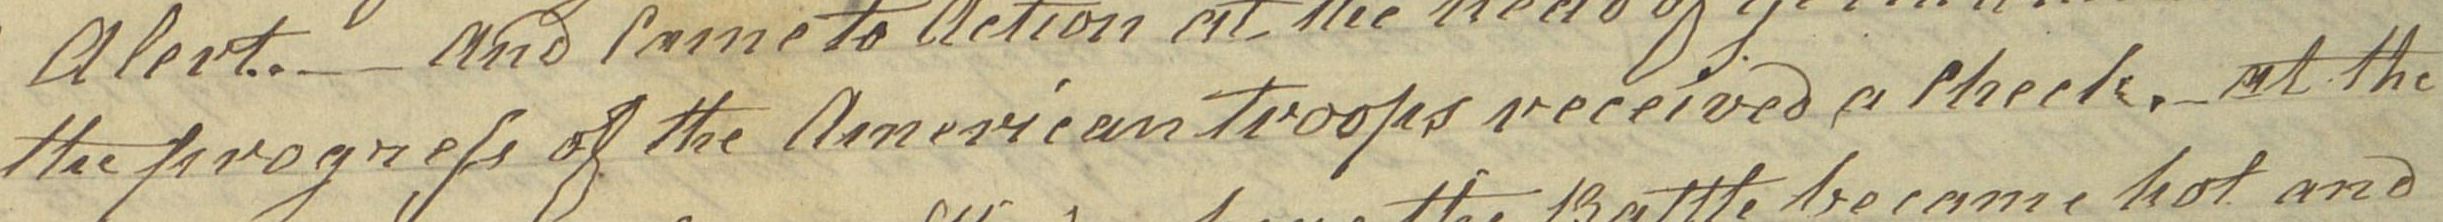the progress of the American troops received a Check, at the
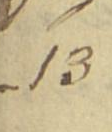13
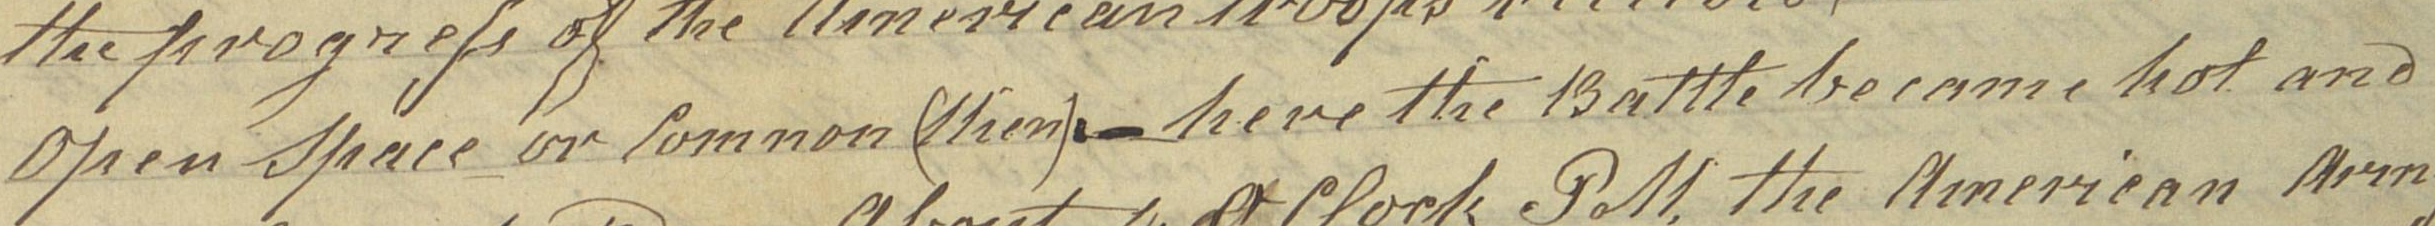Open Space or Common (then), here the Battle became hot and
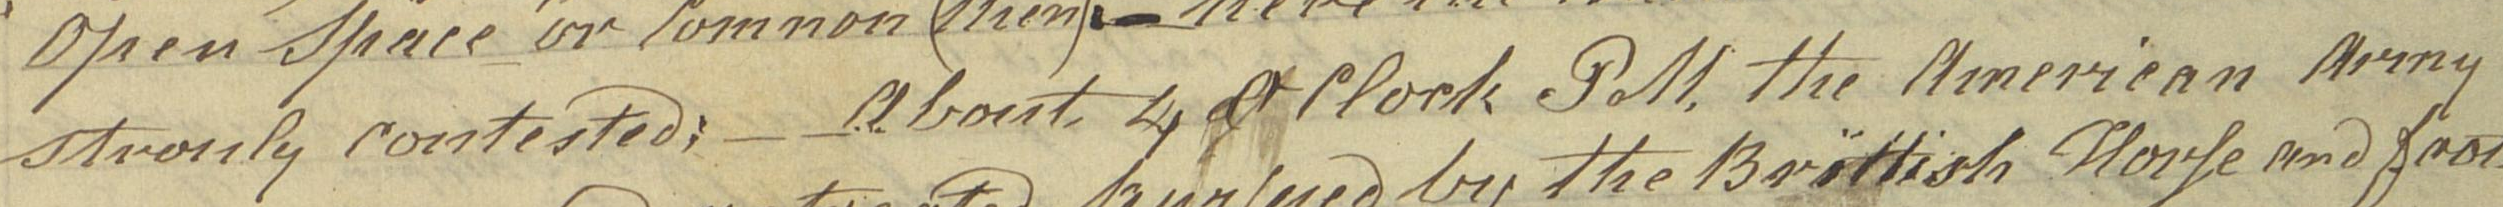stronly contested; About 4 O Clock Poll the American Army
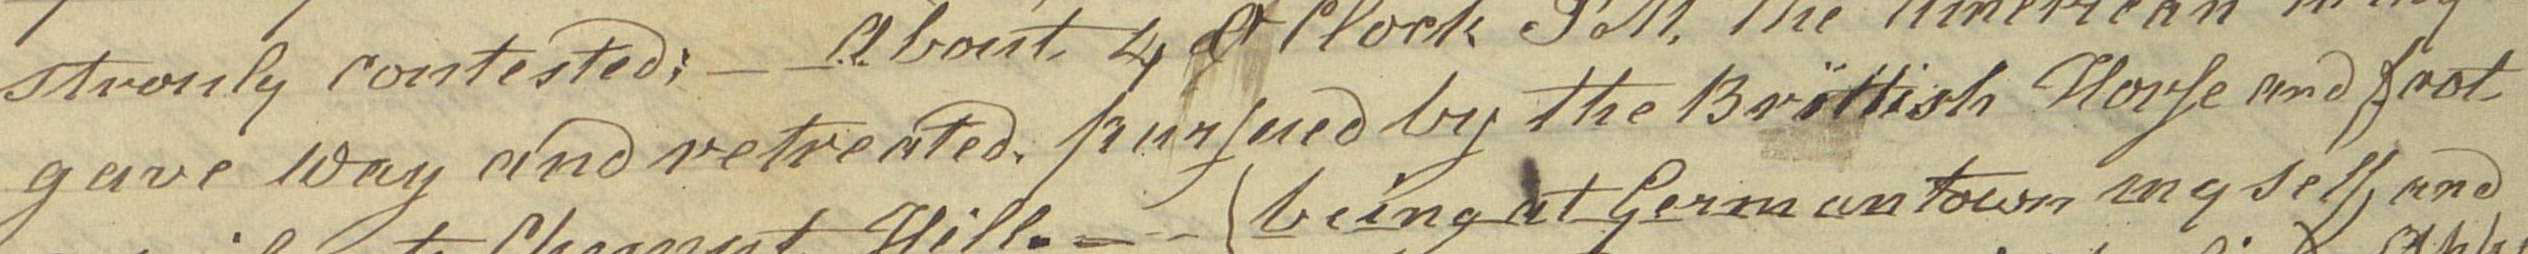gave way and retreated pursued by the Brittish Horse and foot
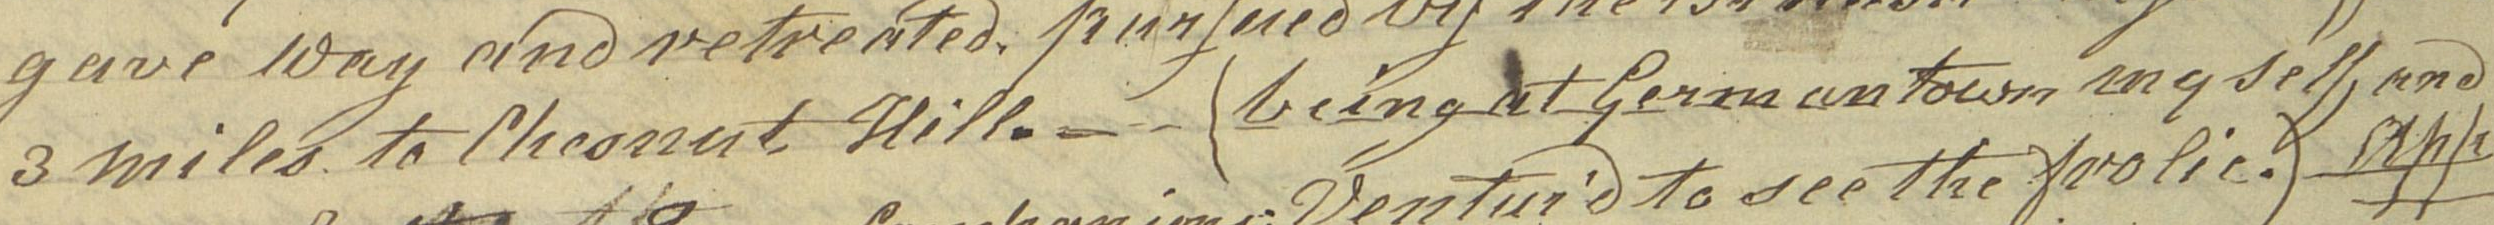3 miles to Chesnut Hill. (being at Germantown myself and
